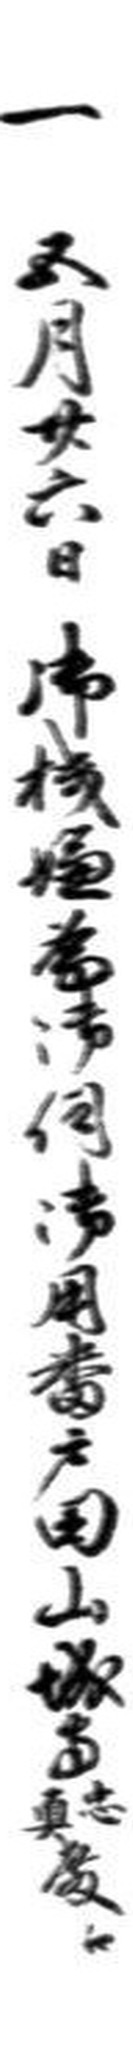一五月廿六日御機嫌為御伺御用番戸田山城守忠真殿江

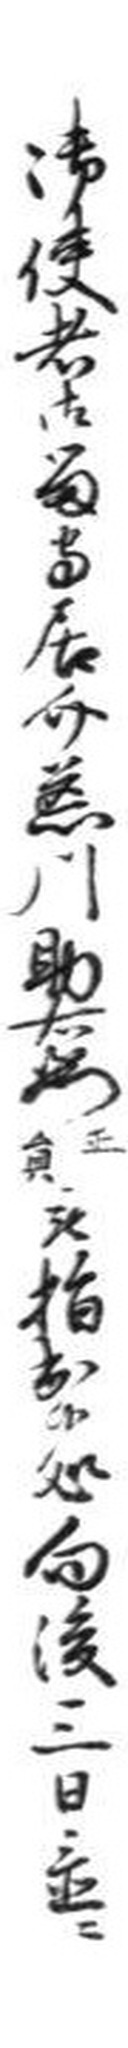御使者御留守居介荒川助右衛門正員被指出候処向後三日置ニ
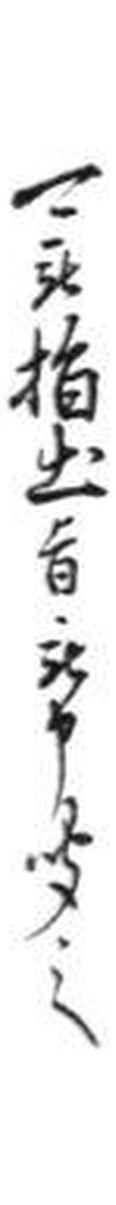可被指出旨被申聞之
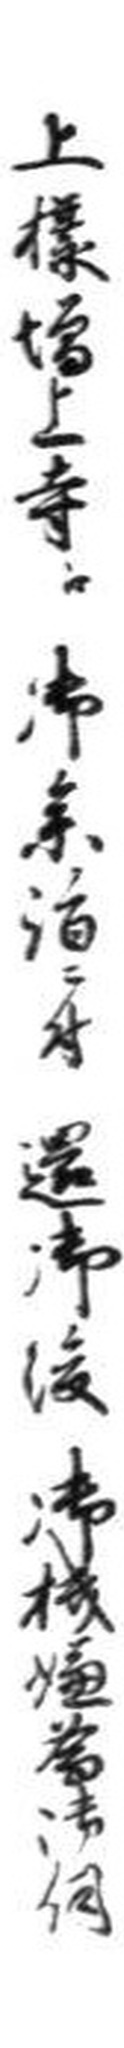上様増上寺江御参詣ニ付還御後御機嫌為御伺
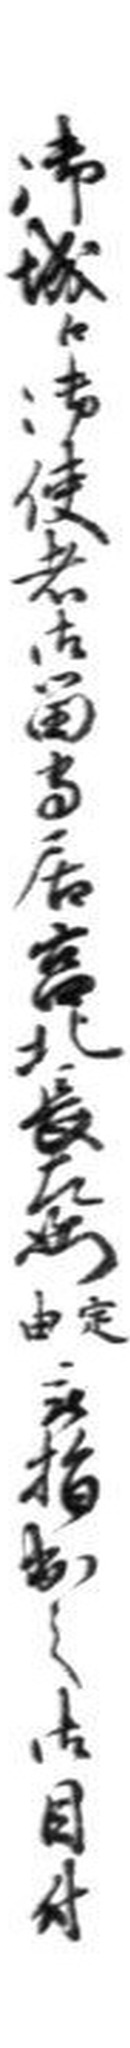御城江御使者御留守居宮北長左衛門定由被指出之御目付
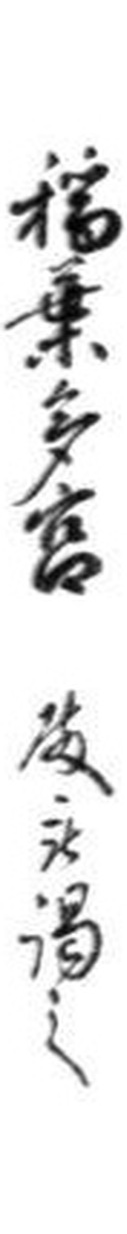稲葉多宮殿被謁之
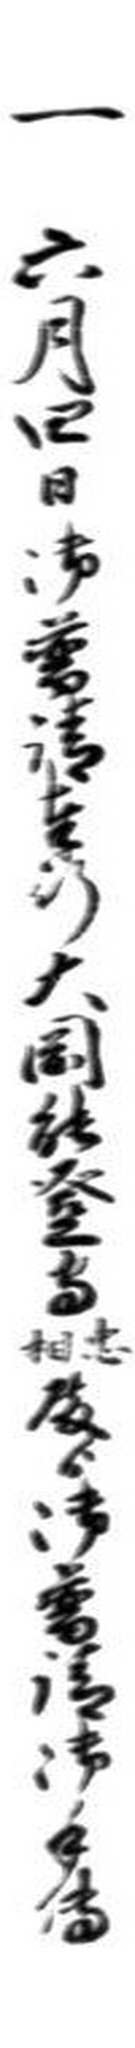一六月四日御普請奉行大岡能登守忠相殿ゟ御普請御手伝
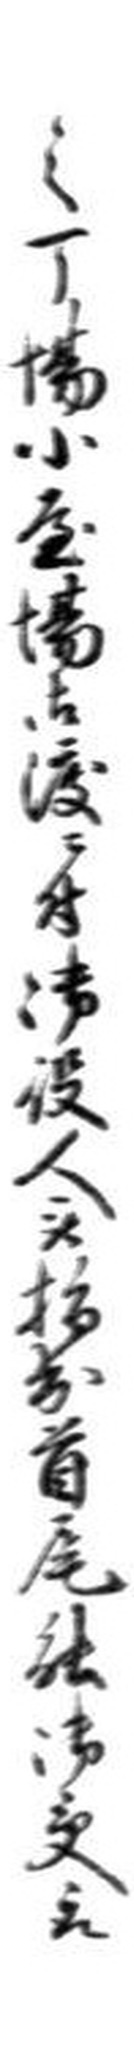之丁場小屋御渡ニ付御役人被指出首尾能御受取
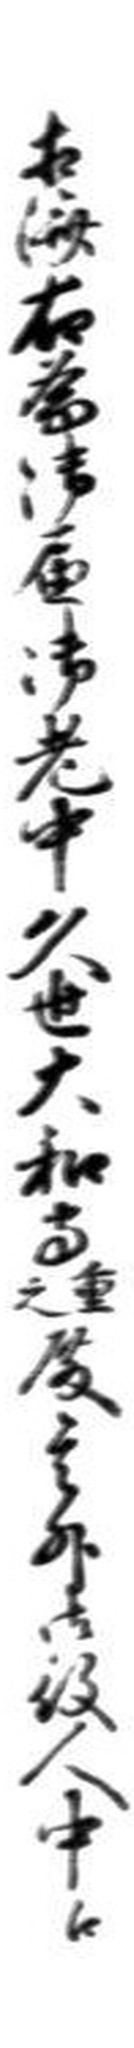相済右為御届御老中久世大和守重之殿其外御役人中江
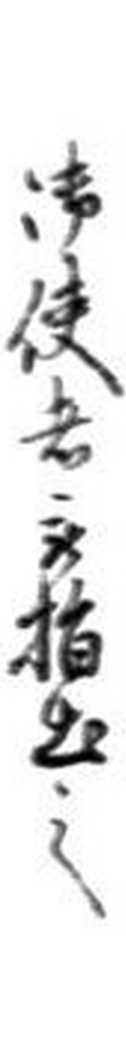御使者被指出之
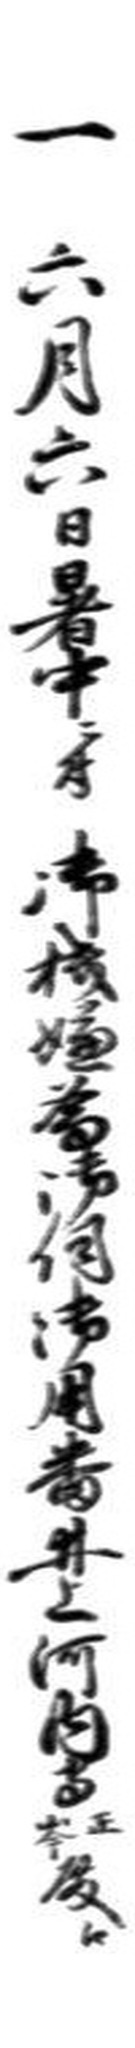一六月六日暑中ニ付御機嫌為御伺御用番井上河内守正岑殿江
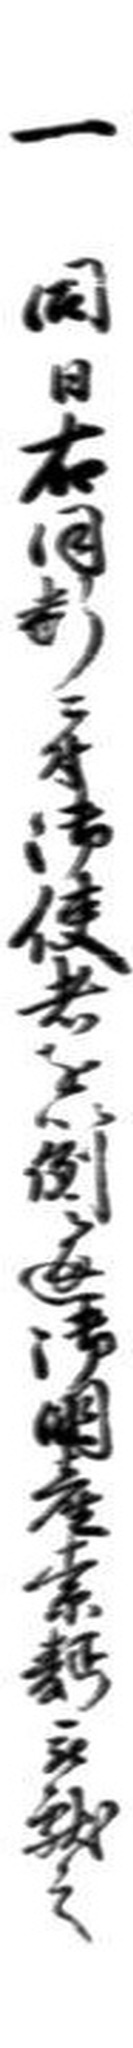一同日右同断ニ付御使者を以例之通御国産索麪被献之
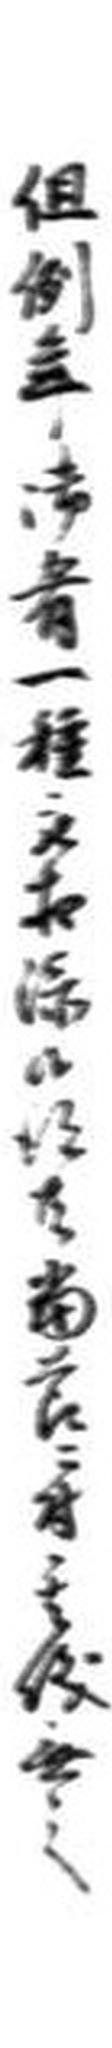但例年御肴一種被相添候得共当節ニ付其儀無之

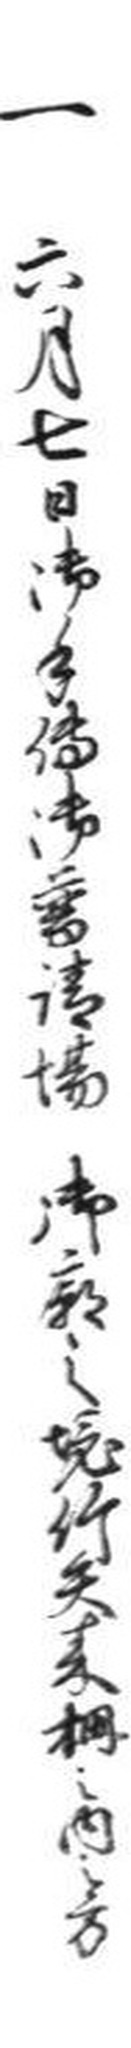一六月七日御手伝御普請場御郭之境竹矢来柵之内之方
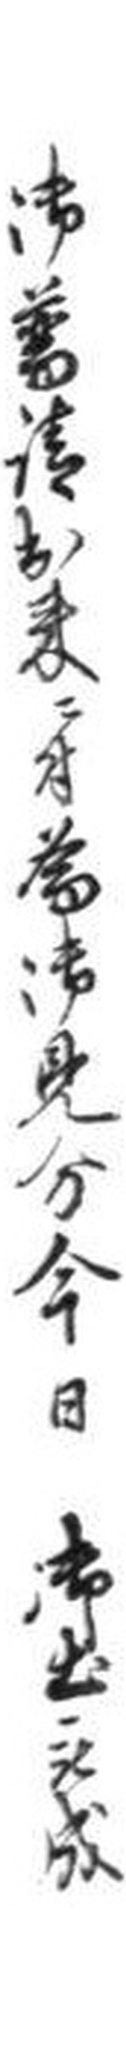御普請出来ニ付為御見分今日御出被成
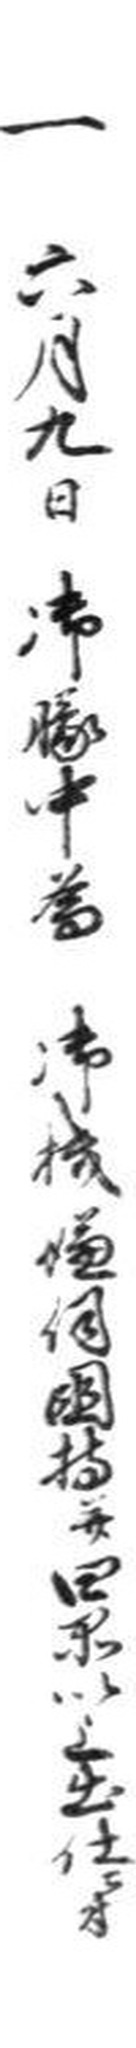一六月九日御朦中為御機嫌伺国持并四品以上出仕ニ付
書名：家譜 三十一 吉邦公 享保元年
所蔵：福井県文書館 Fukui Prefectural Archives
